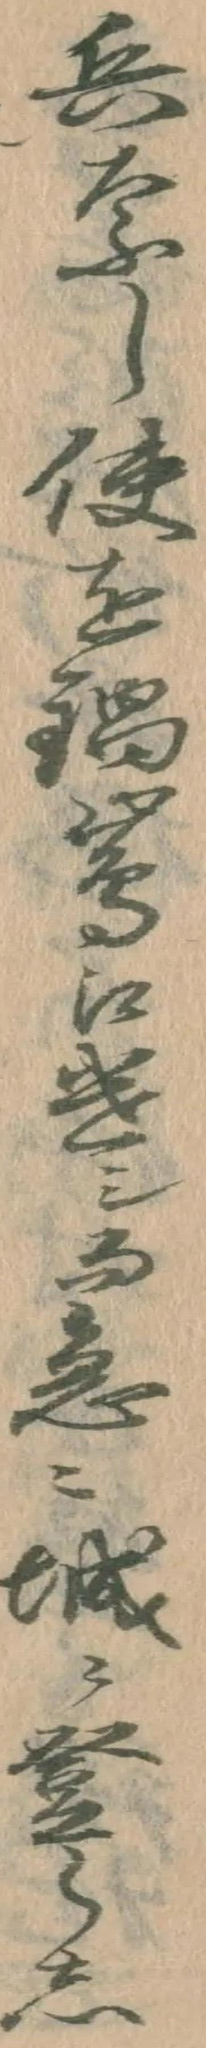兵奈し使を鍋島江遣し而急に城に登ら志
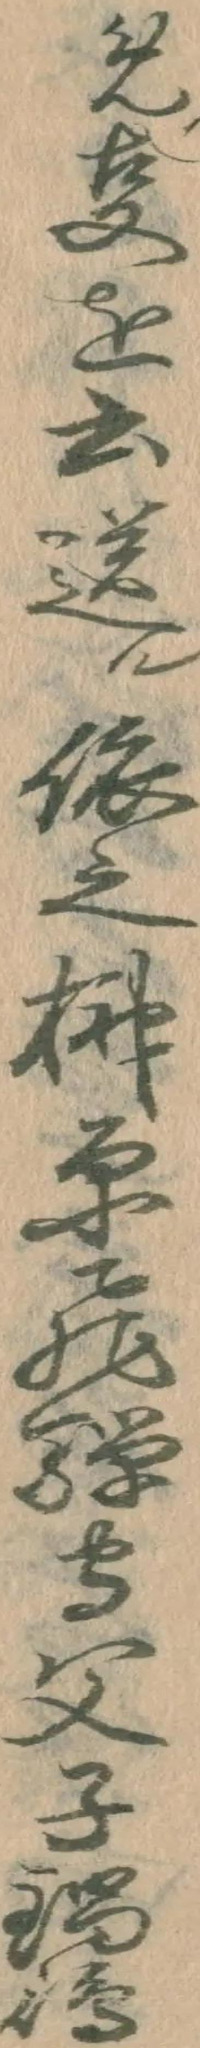免ん事を云送候之榊原飛騨守父子鍋島
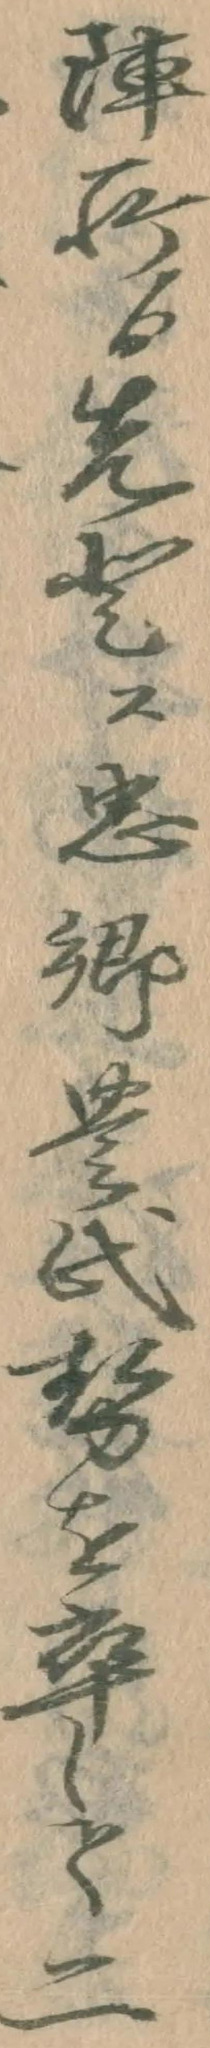陣所ゟ先登す忠郷豊氏勢を卒して二
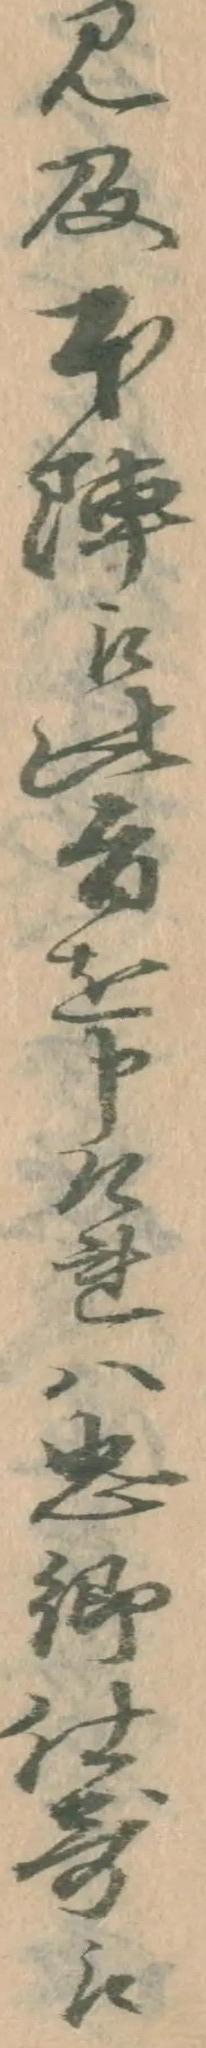見及本陣江此旨を申け連は忠郷仕寄江

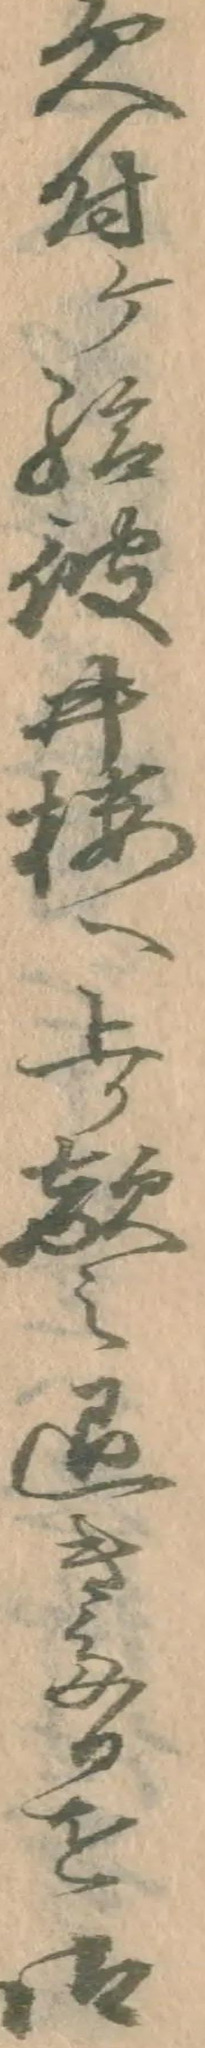欠付け給彼井樓へ上り敵之退き多るを御
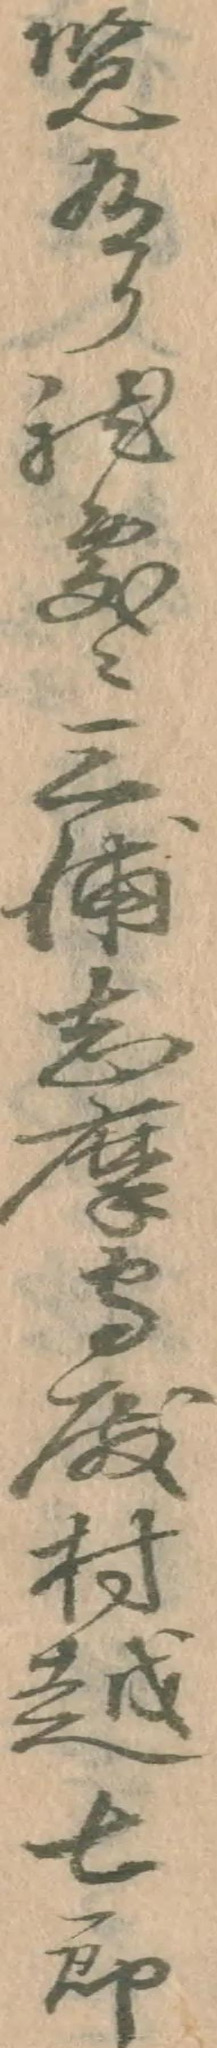覧有り然處に三浦志摩守殿村越七郎
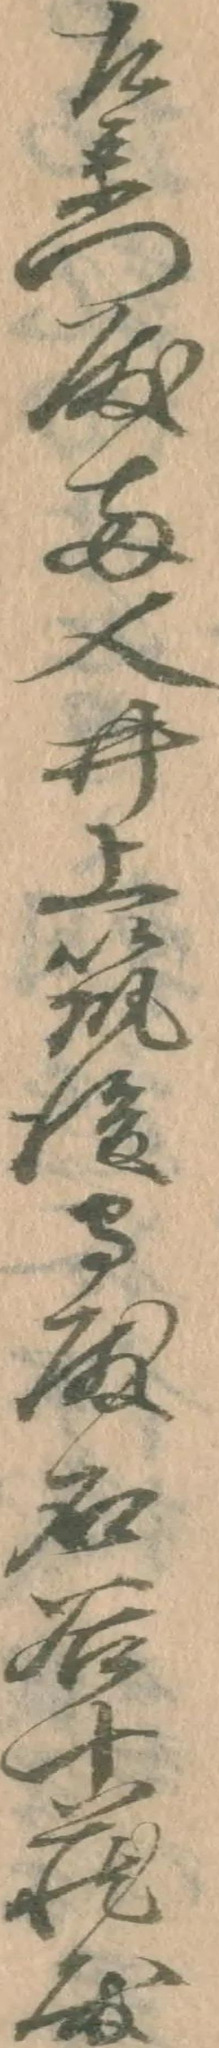左衛門殿両人井上筑後守殿石谷十蔵殿
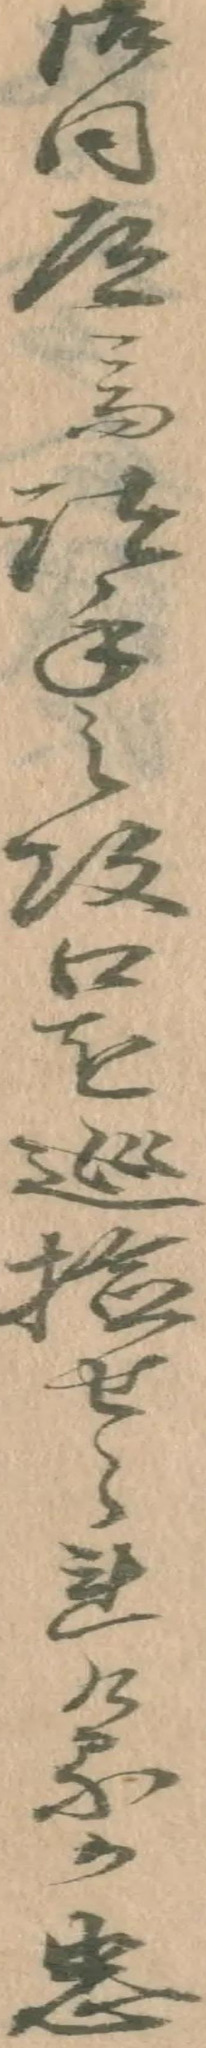御同道に而諸手之攻口を巡拾せら連けるか忠
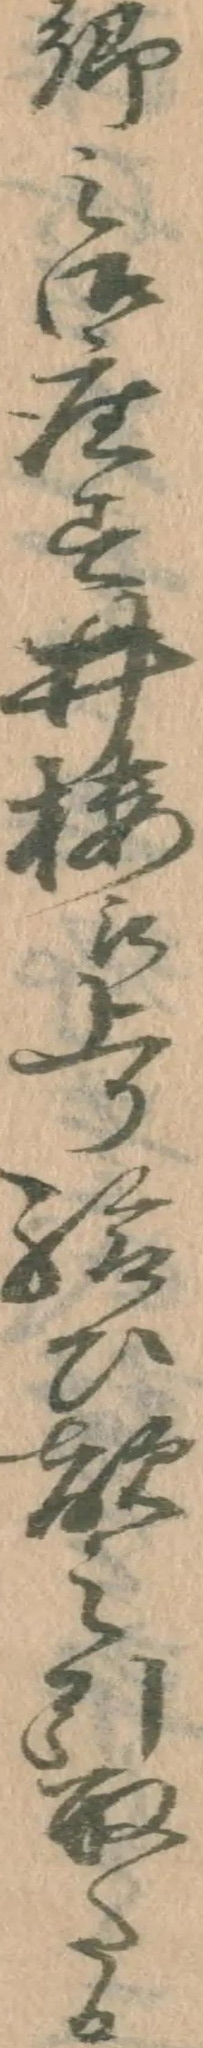郷之御座春井樓江上り給ひ敵之引取たる
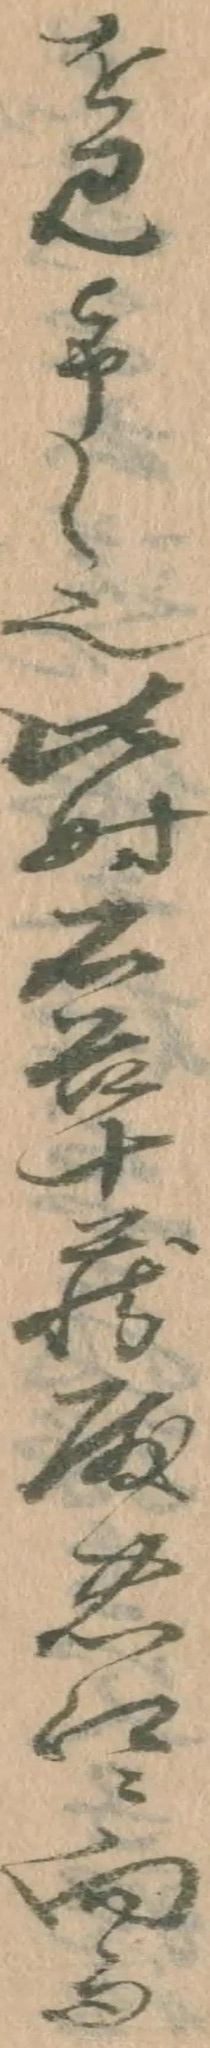を見被申し也此時石谷十蔵殿忠郷に向而
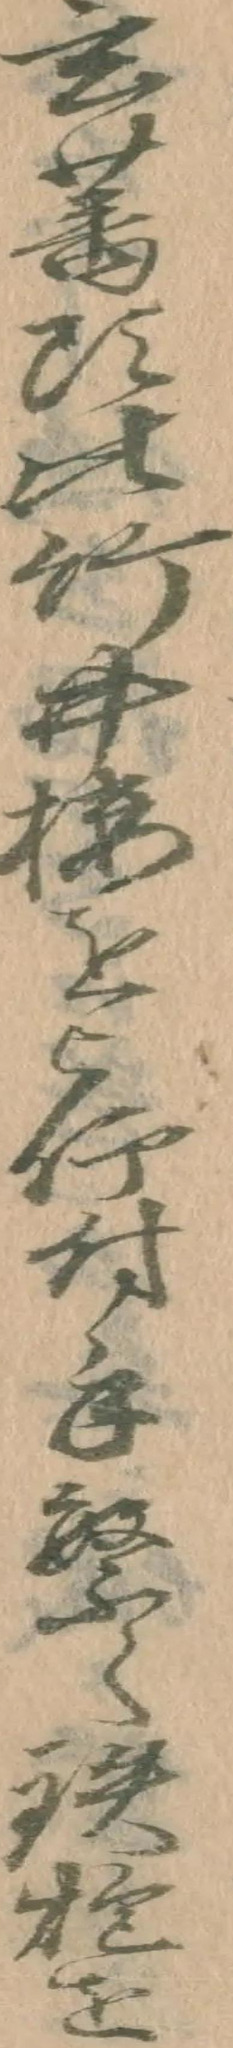玄蕃頭此竹井樓を被仰付手繁く鉄砲を
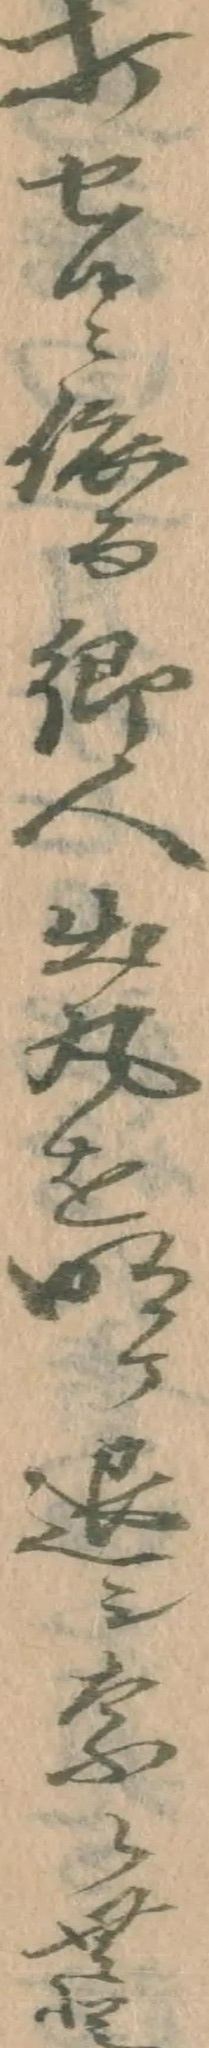打せ候に依而郷人出丸を明け退し奈ら無登
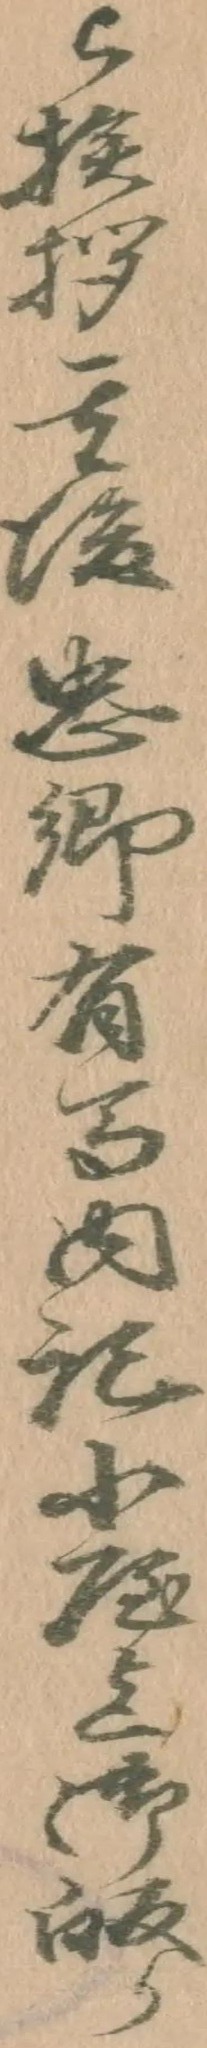被挨拶其後忠郷有馬内記小屋迄御皈り
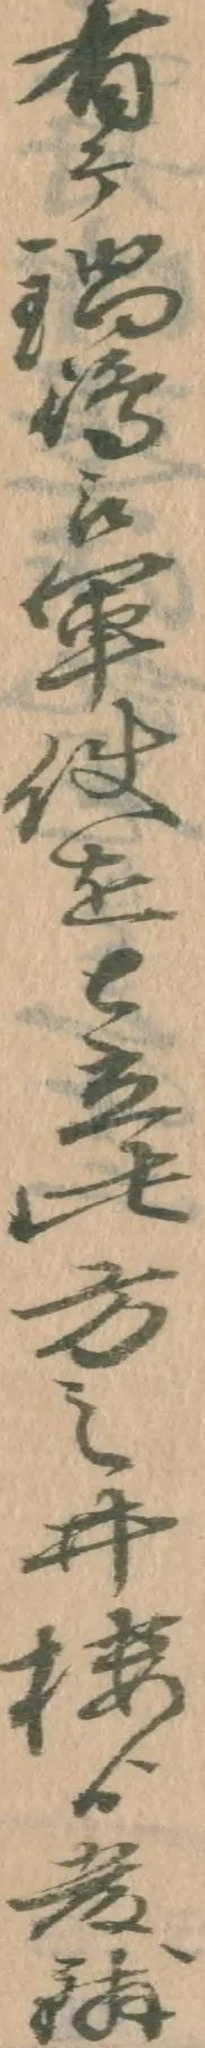有け鍋島江軍使を被立此方之井樓ゟ厳鋪
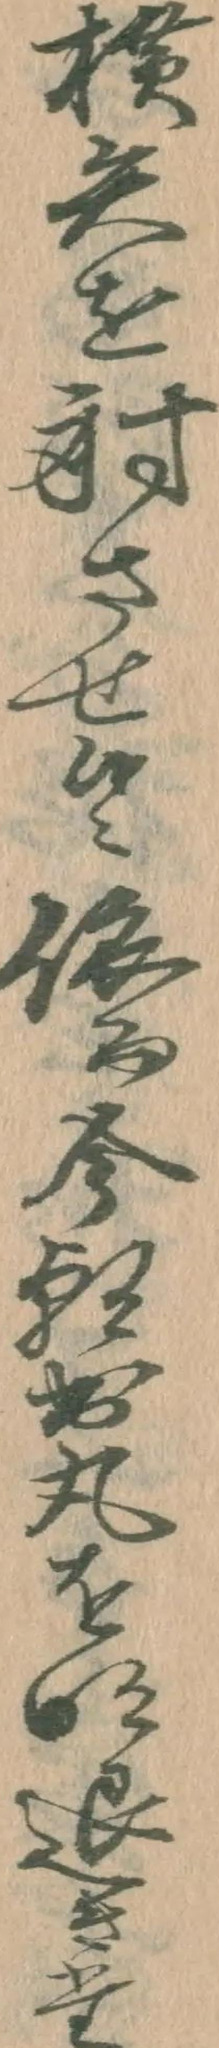横矢を射させ候に依而今朝出丸を明退き堂
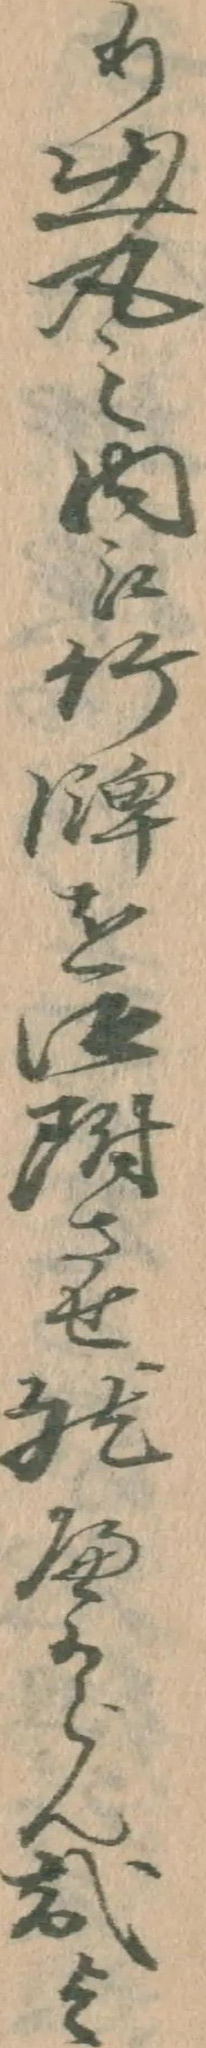り出丸之内江竹牌を御附させ然扁からん哉与
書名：切支丹御退治記 49巻. [8]
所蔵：国立国会図書館 National Diet Library, JAPAN
